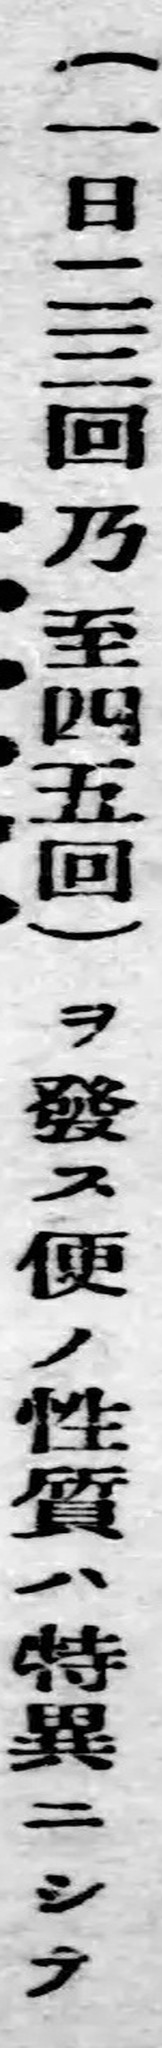(一日二三回乃至四五回)ヲ發ス便ノ性質ハ特異ニシテ
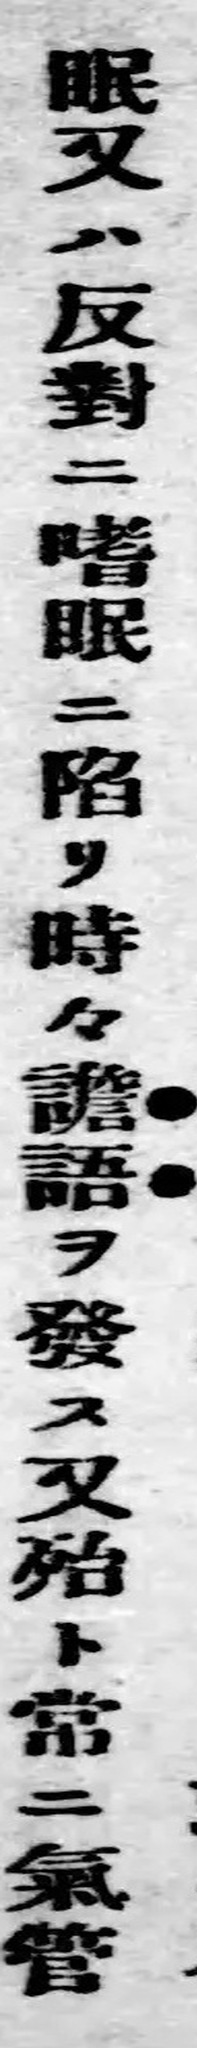眠又ハ反対ニ嗜眠ニ陷リ時々譫語ヲ發ス又殆ト常ニ氣管
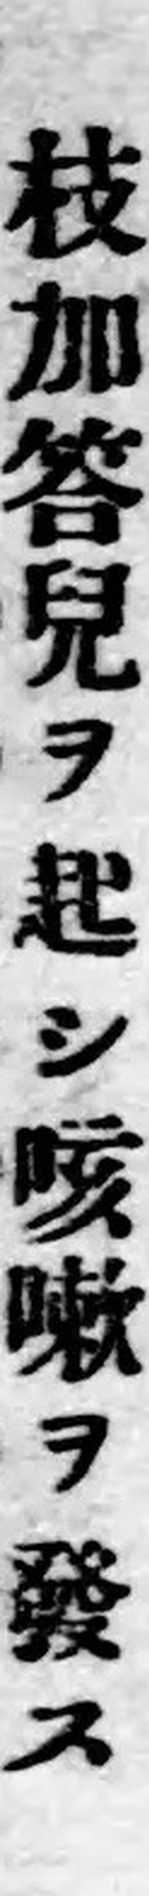枝加答兒ヲ起シ咳嗽ヲ發ス
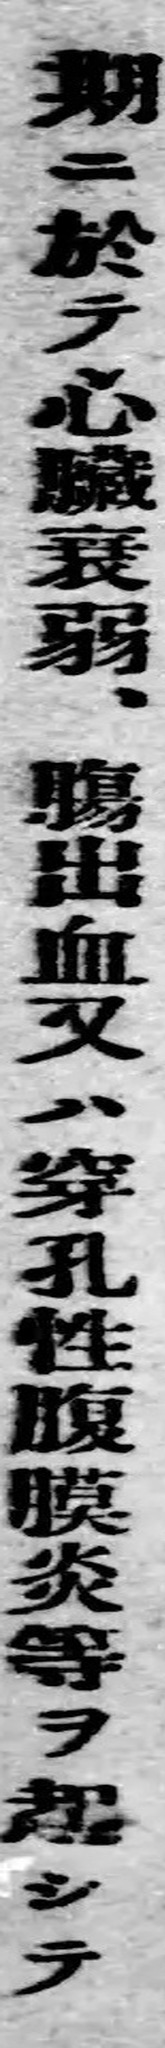期ニ於テ心臟衰弱、膓出血又ハ穿孔性腹膜炎等ヲ起シテ
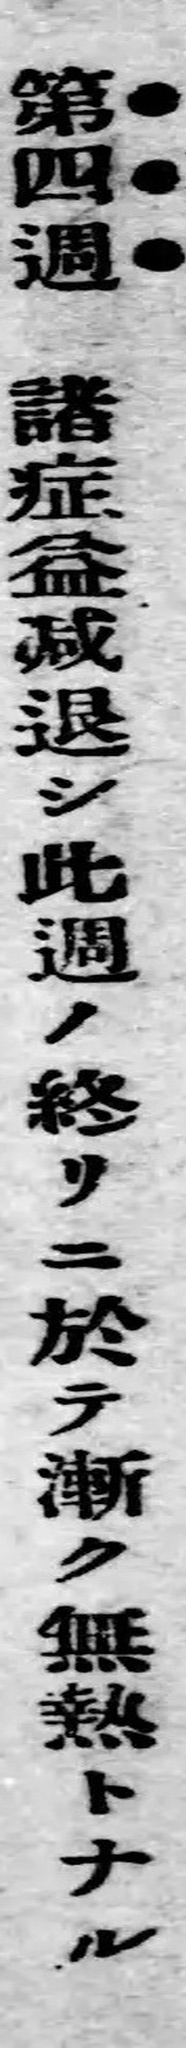第四週諸症益減退シ此週ノ終リニ於テ漸ク無熱トナル
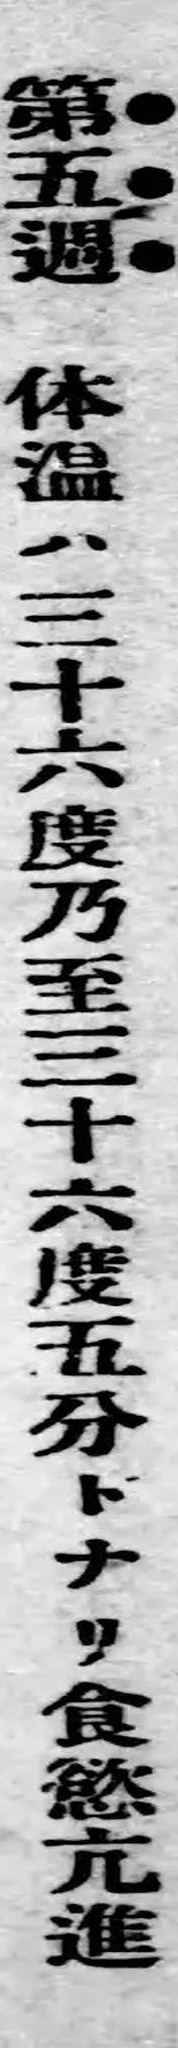第五週体温ハ三十六度乃至三十六度五分トナリ食慾亢進
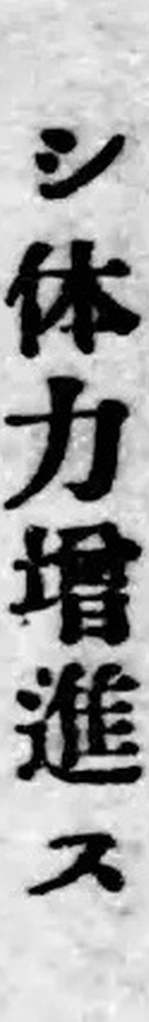シ体力增進ス
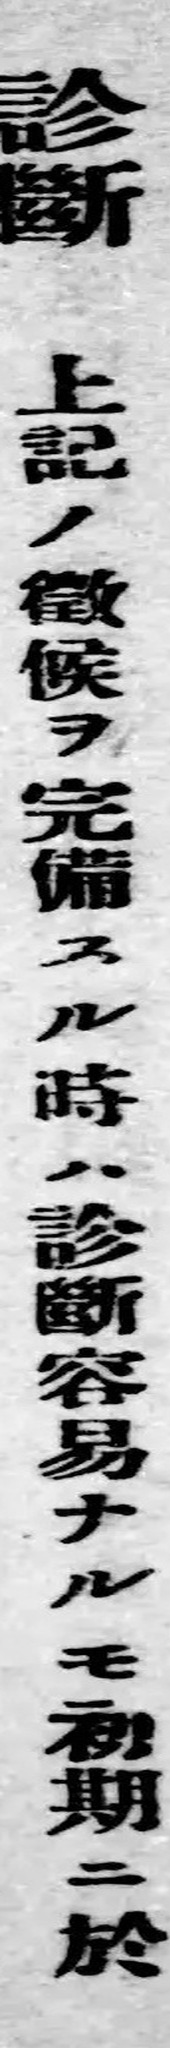診斷上記ノ徴候ヲ完備スル時ハ診斷容易ナルモ初期ニ於
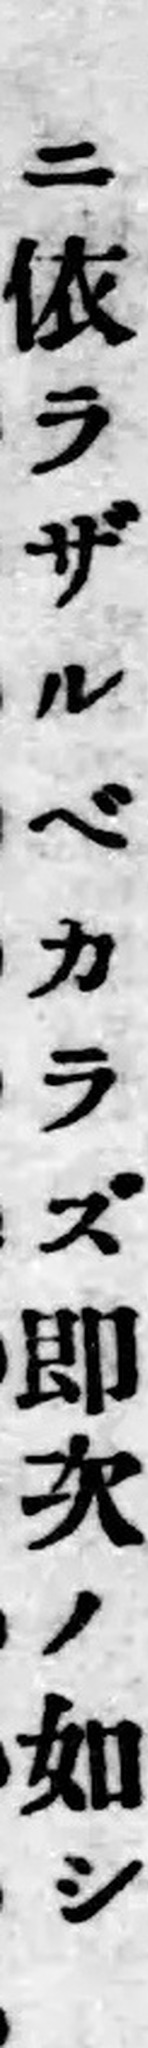ニ依ラザルベカラズ即次ノ如シ

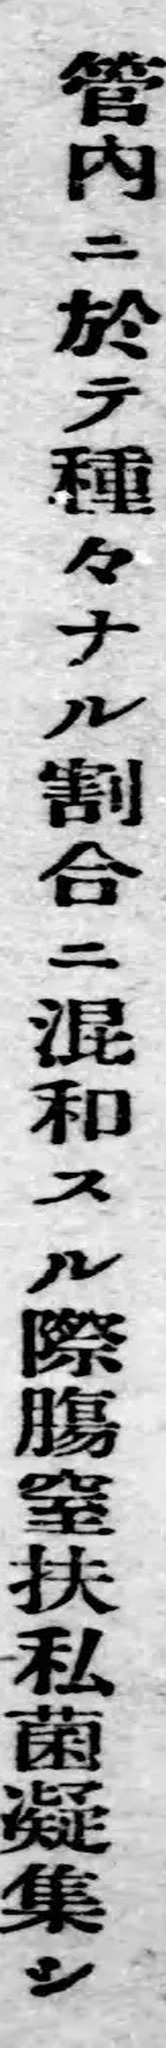管内ニ於テ種々ナル割合ニ混和スル際膓窒扶私菌凝集シ
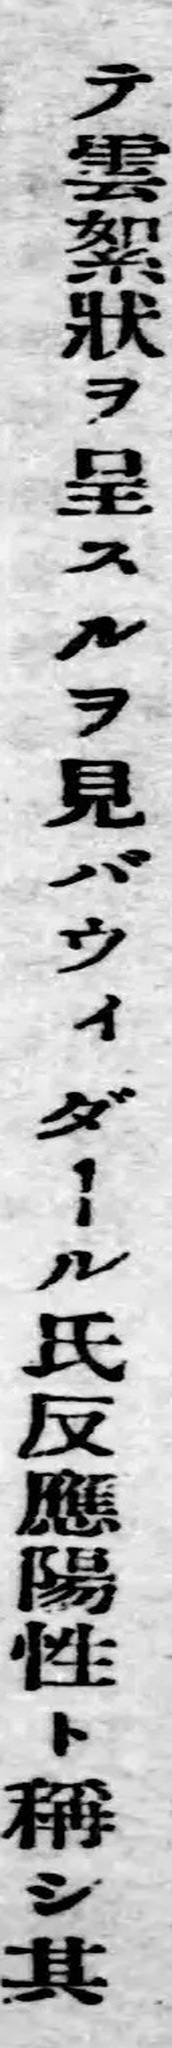テ雲絮狀ヲ呈スルヲ見バウィダール氏反應陽性ト稱シ其
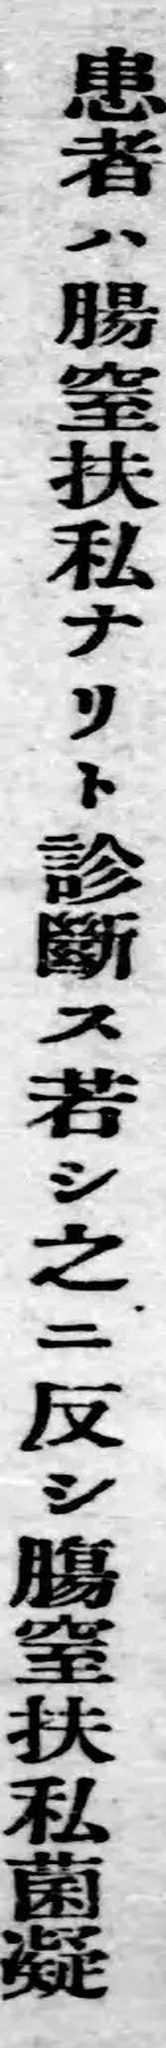患者ハ膓窒扶私ナリト診斷ス若シ之ニ反シ膓窒扶私菌凝
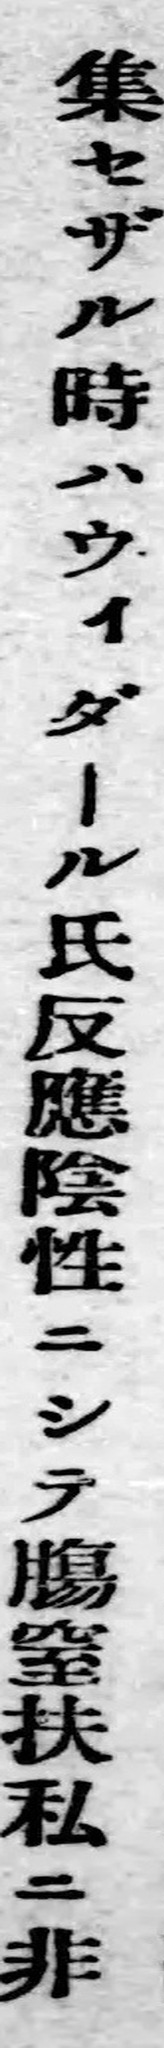集セザル時ハウィダール氏反應陰性ニシテ膓窒扶私ニ非
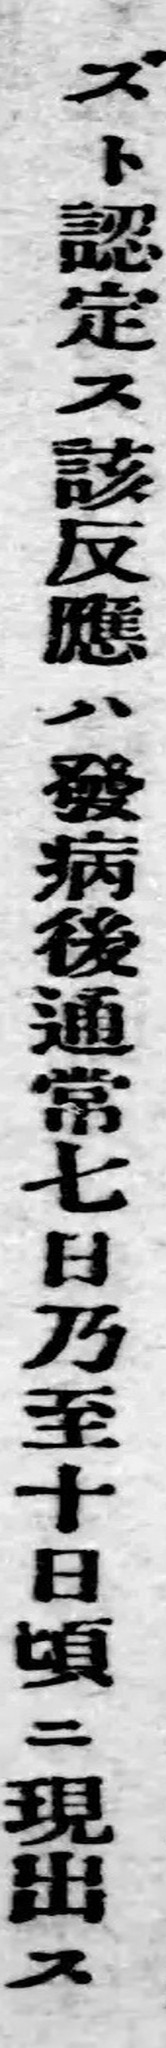ズト認定ス該反應ハ發病後通常七日乃至十日頃ニ現出ス
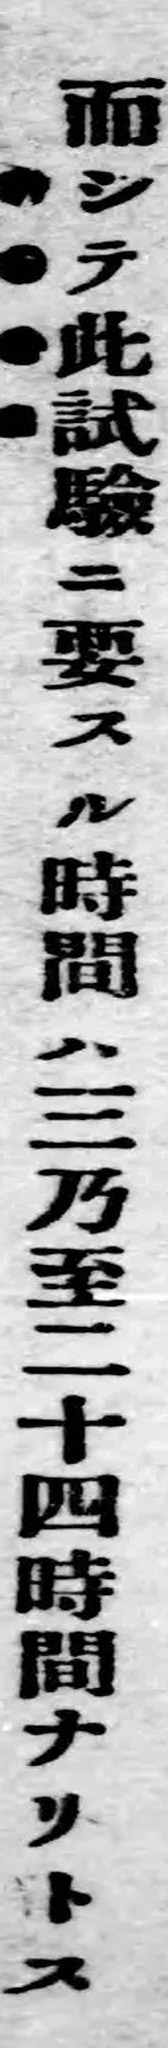而シテ此試驗ニ要スル時間ハ三乃至二十四時間ナリトス
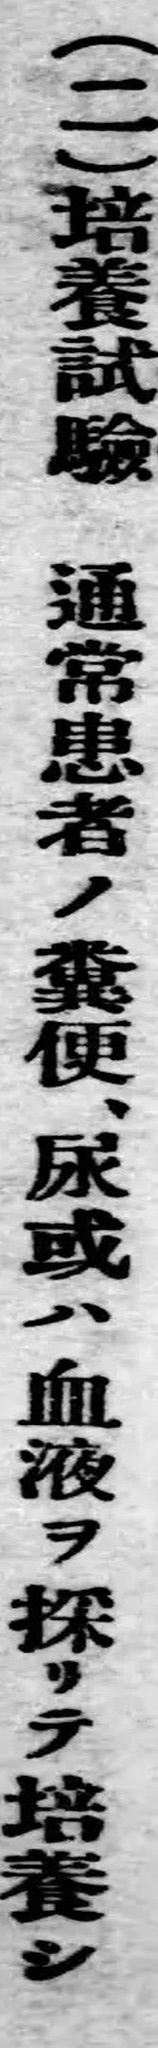(二)培養試験通常患者ノ糞便、尿或ハ血液ヲ採リテ培養シ
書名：袖珍防疫必携
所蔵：国立国会図書館 National Diet Library, JAPAN
